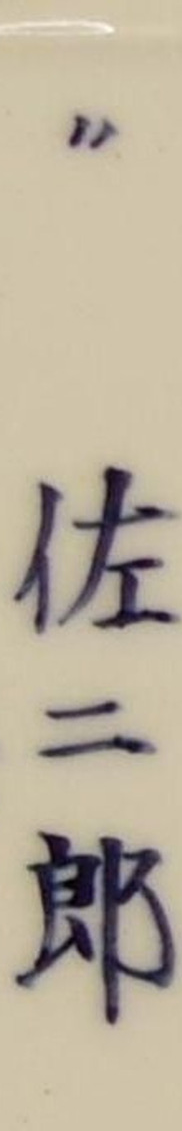佐二郎
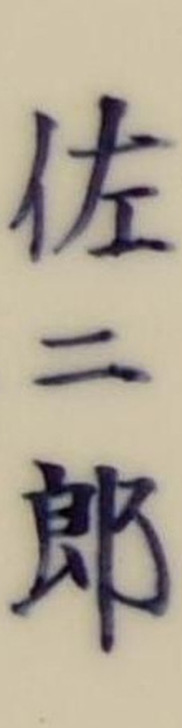佐二郎

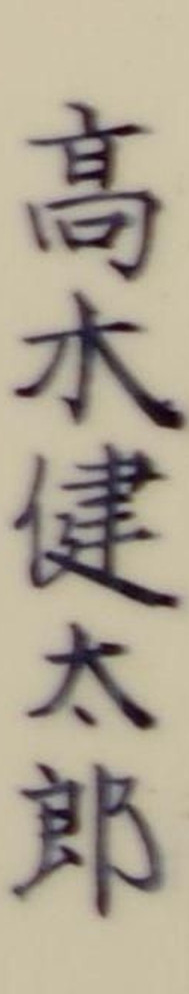高木健太郎
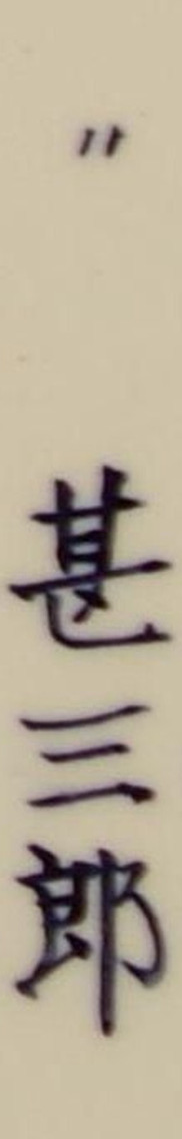甚三郎
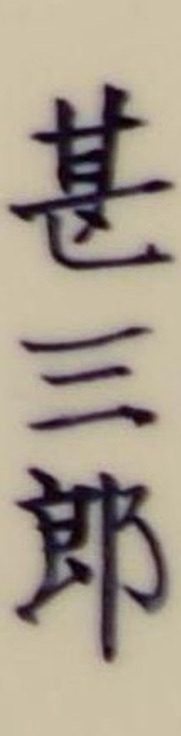甚三郎
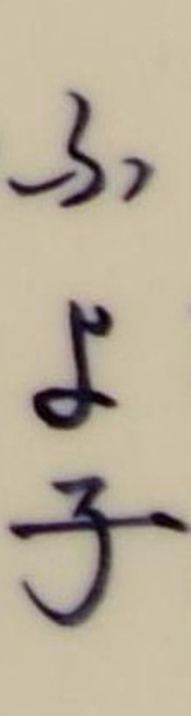ふよ子
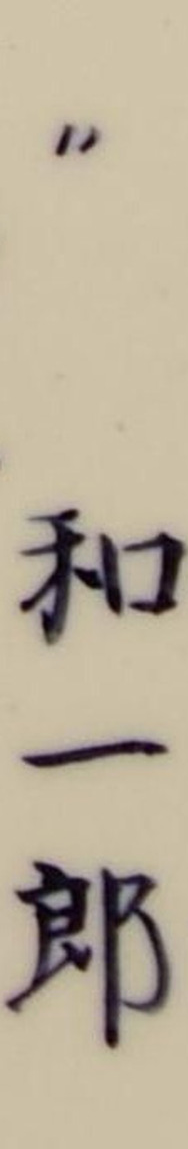和一郎
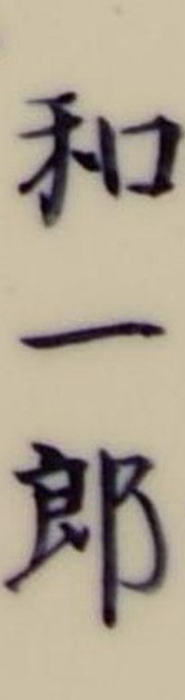和一郎
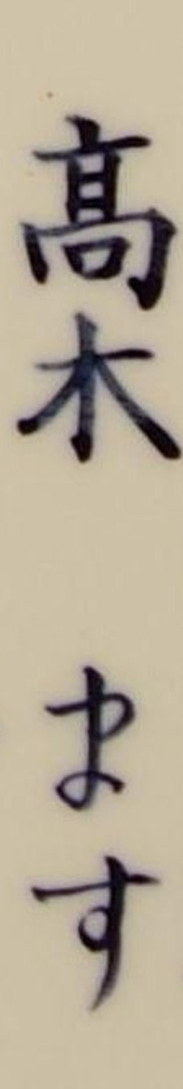高木ます
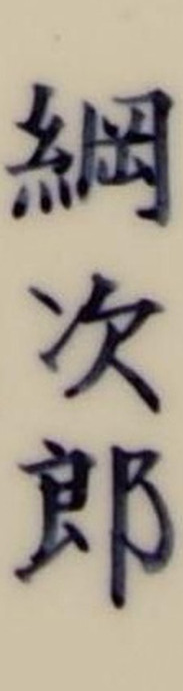綱次郎
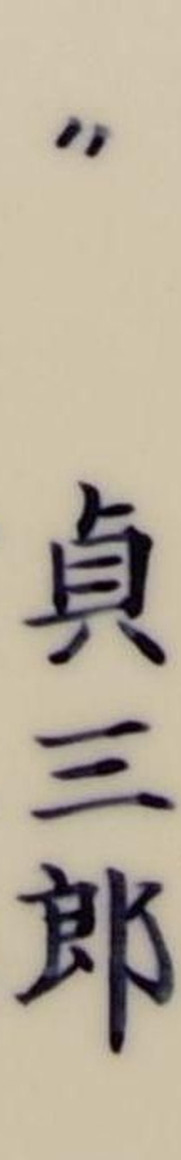貞三郎
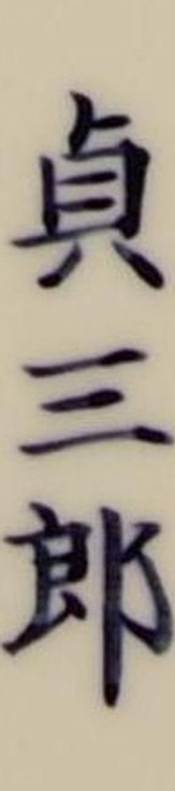貞三郎
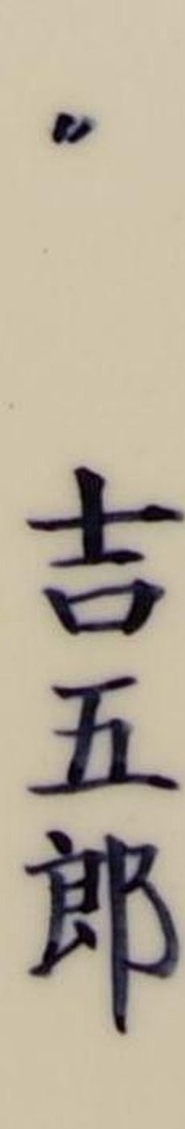吉五郎
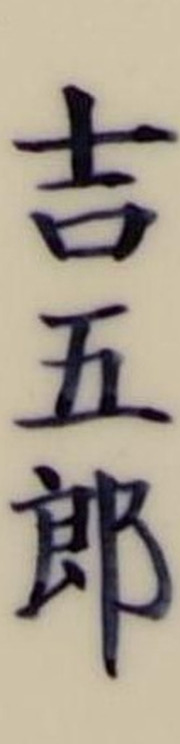吉五郎
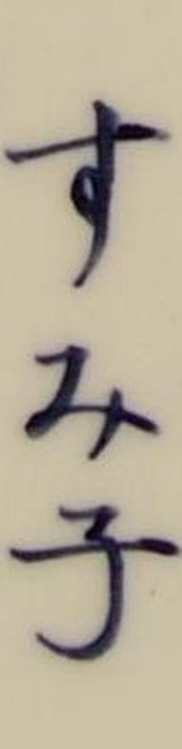すみ子
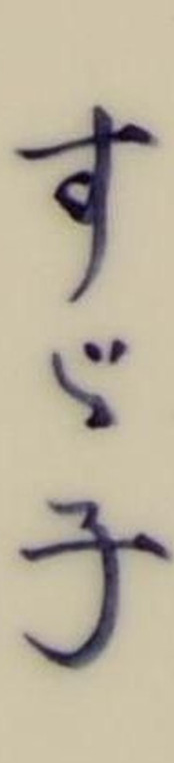すゞ子
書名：E~L
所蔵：高野山金剛峯寺
